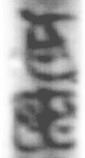聶（攝）
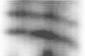二
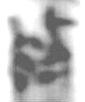紫
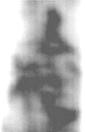○（錦）
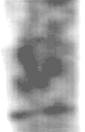之
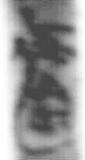○（箙）
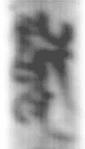○（豻）
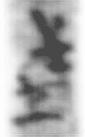○（飾）
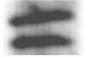二
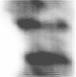二
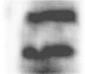二
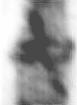屯
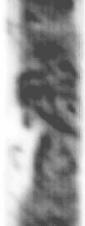○（蒙）
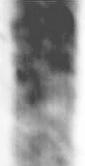○（羽）
